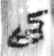西
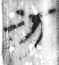方
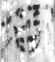高
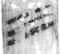三
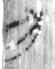方
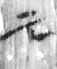下
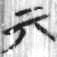亓（期）
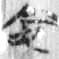○（中）
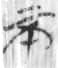不
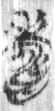壽
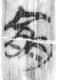宜
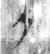人
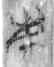民
